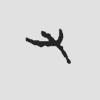又
